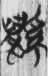貕
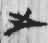之
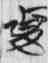妻
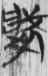○（葬）
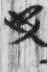𡚦（焉）
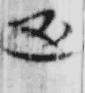疋
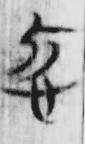忻
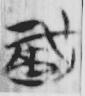戠
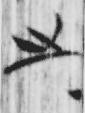之
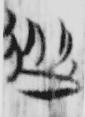從
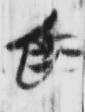爲
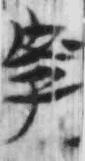李
